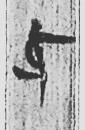与（與）
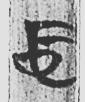𠁩
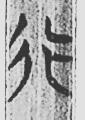行
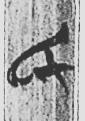氏
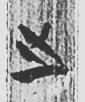之
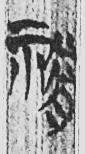禍
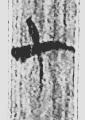七
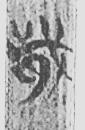歲
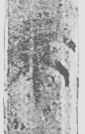不
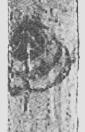解
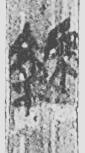{幸虎}
